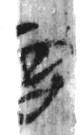言
